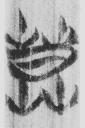莫
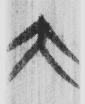大
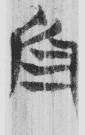於
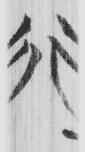行
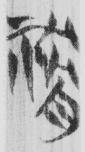禍
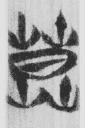莫
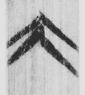大
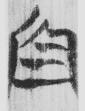於
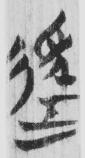{辶㸒}
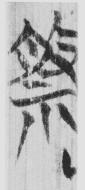祭
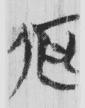佴
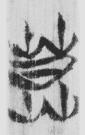莫
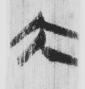大
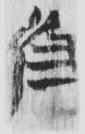於
